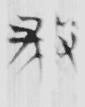救
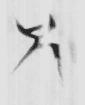兄
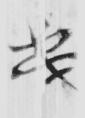弟
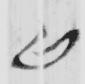㠯（以）
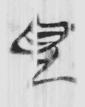見
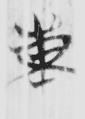東
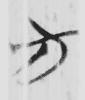方
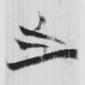之
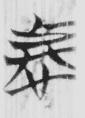者
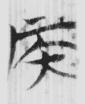侯
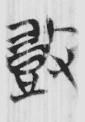敳
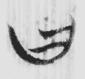曰
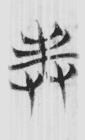奉
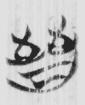晉
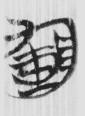軍
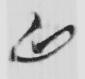㠯（以）
